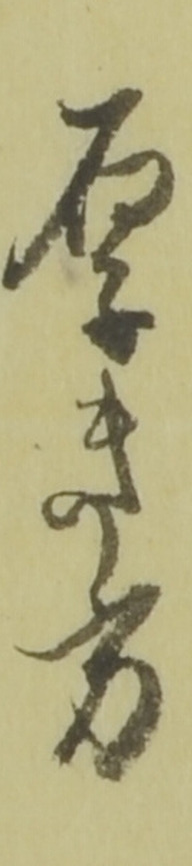厚き方
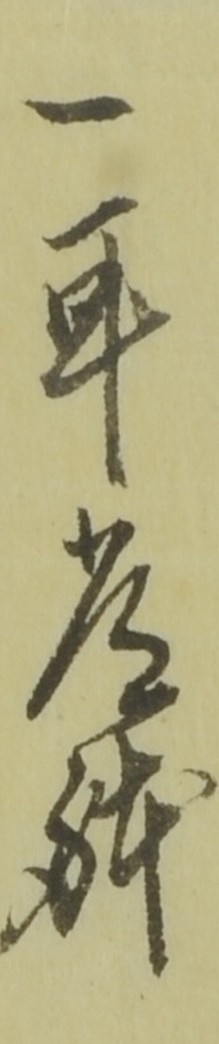一耳常体
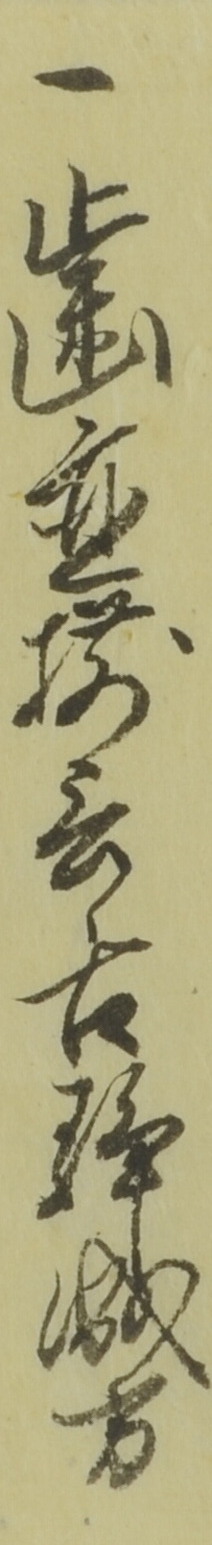一歯並揃言舌静成方
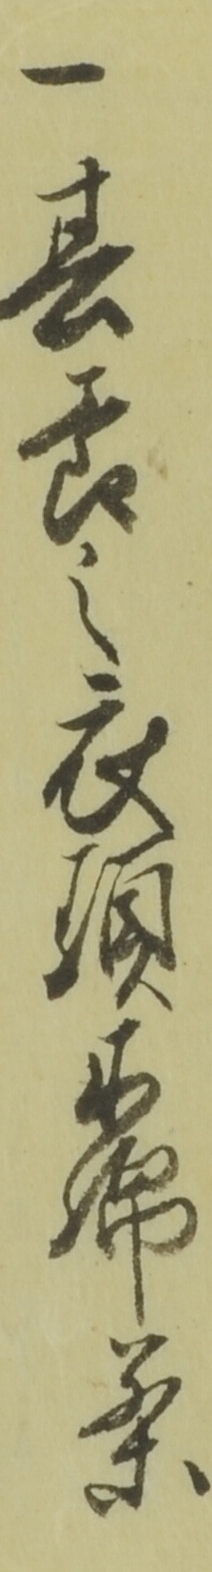一其節之衣類木綿茶
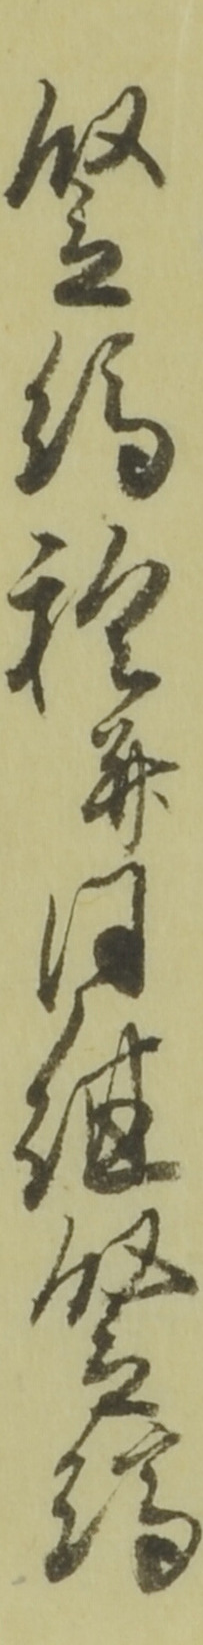竪縞袷并同紺竪縞
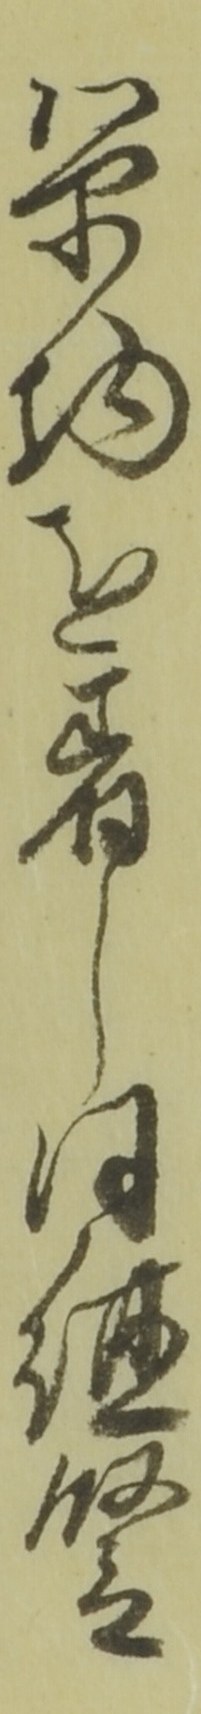単物を着し同紺竪
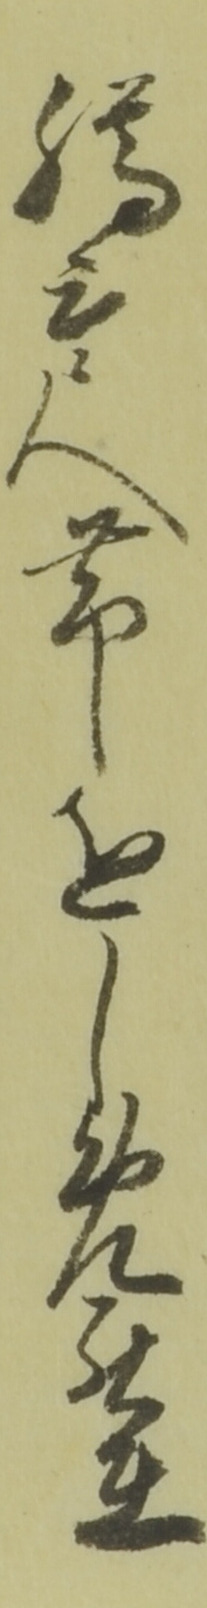縞三尺帯をしめ罷在
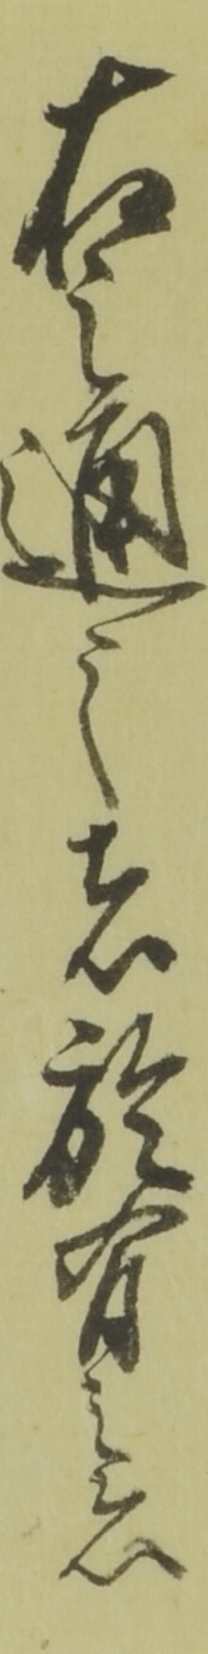右之通之者於有之は
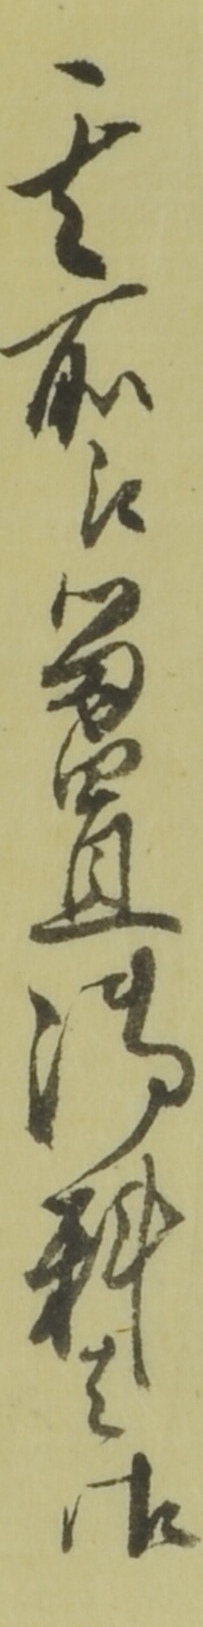其所江留置御料は御
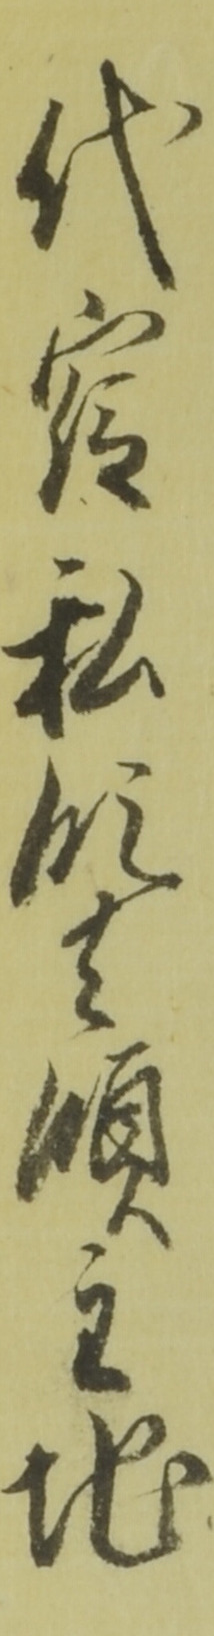代官私領は領主地
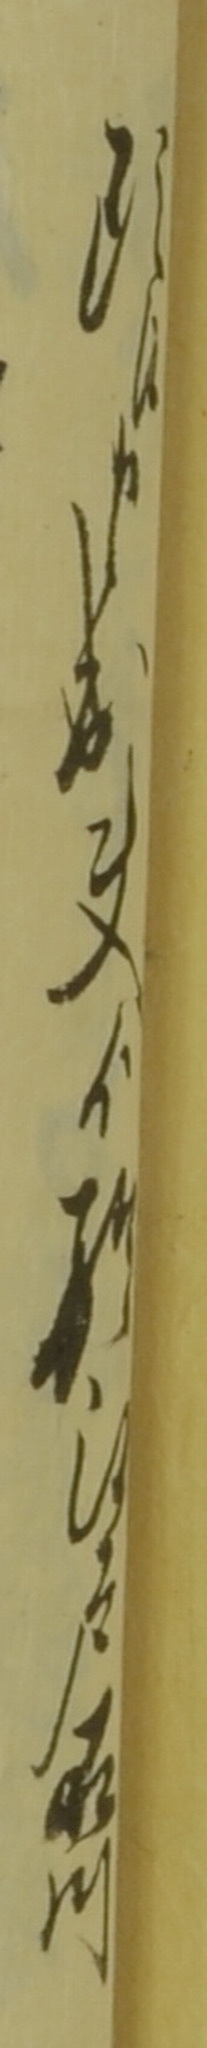頭江申出夫ゟ於江戸石
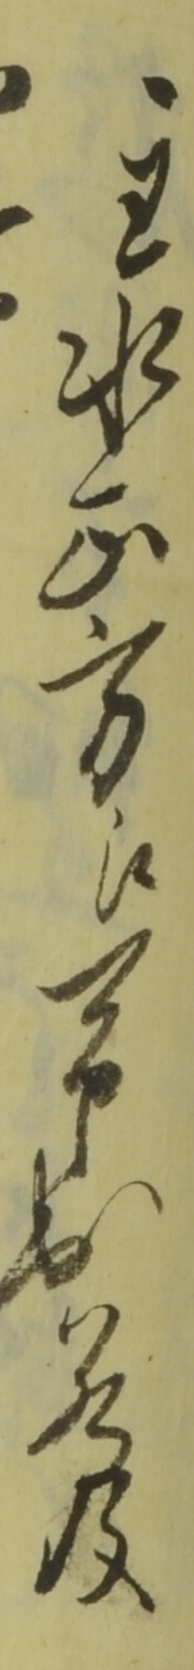主水正方江可申出若及
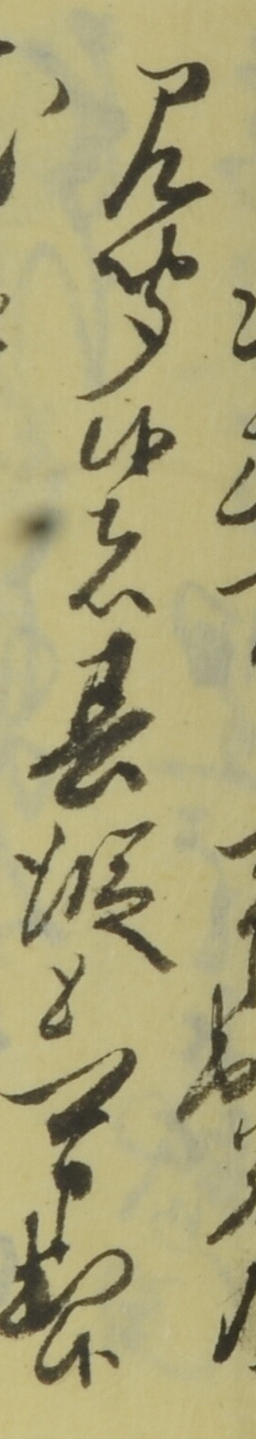見聞候者其段も可申出候
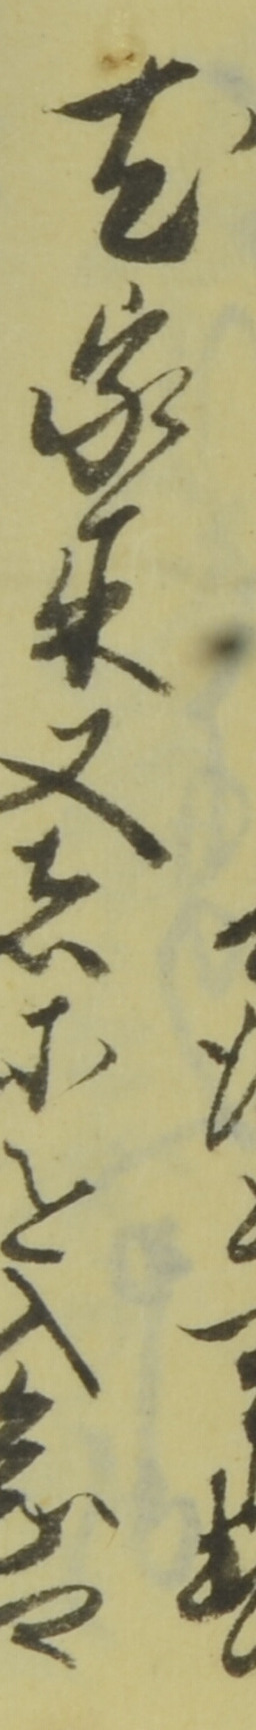尤家来又は等を入念可

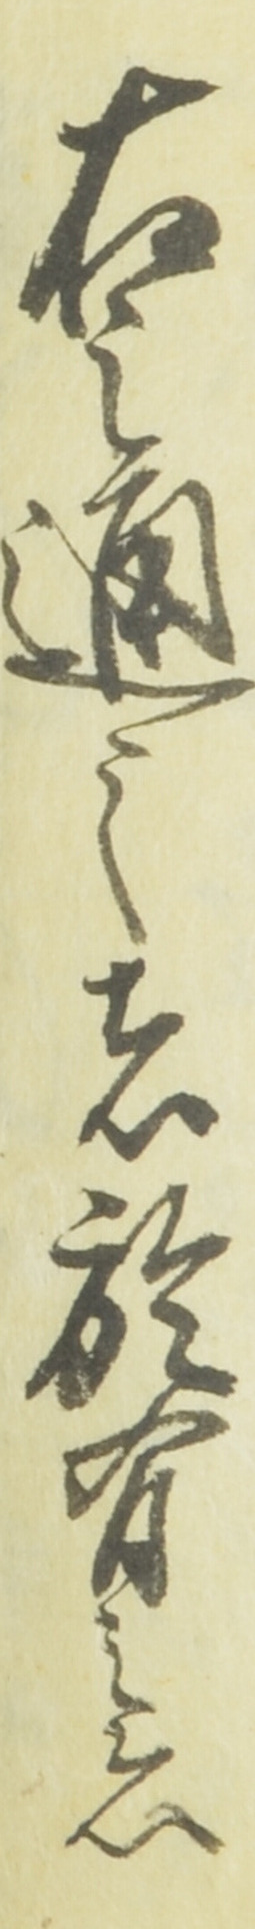右之通之者於有之は
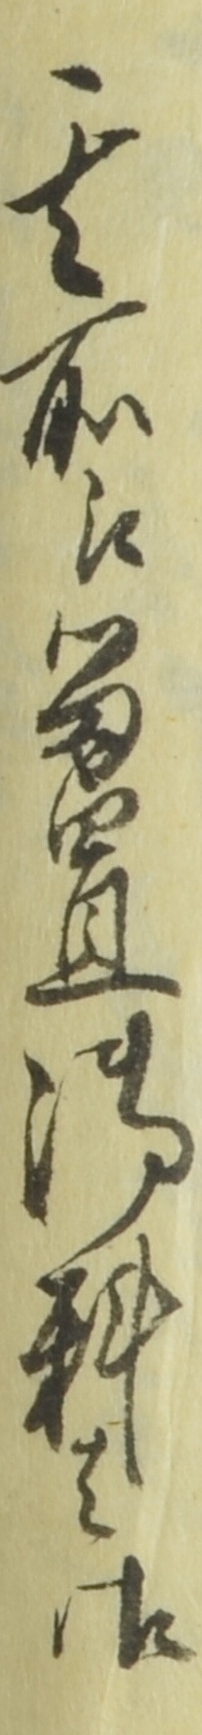其所江留置御料は御
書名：御触書御書附控
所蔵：伊那市立高遠町図書館・合同会社AMANE
